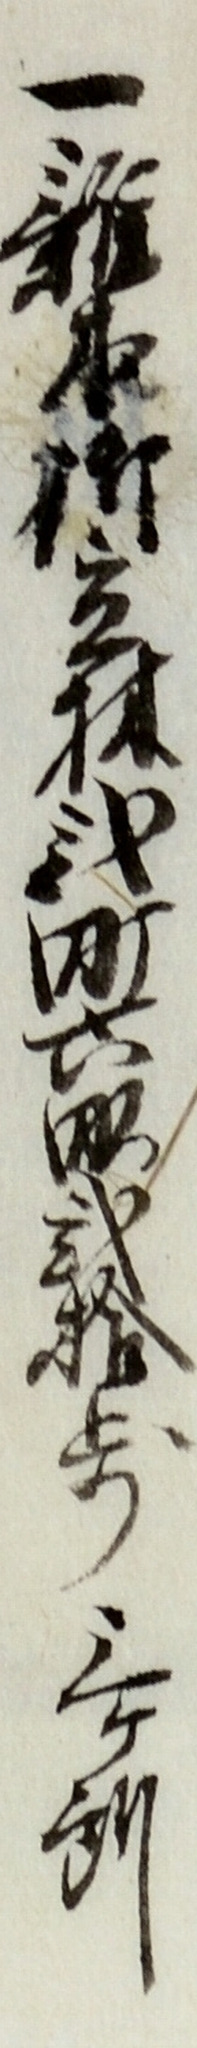一雑木御立林弐町六畝弐拾歩三ヶ所
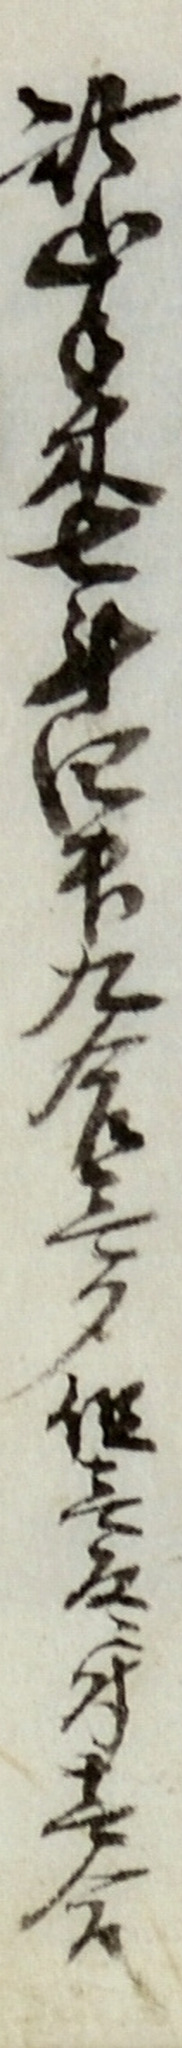此山手米七斗四升九合壱勺但壱反ニ付壱合

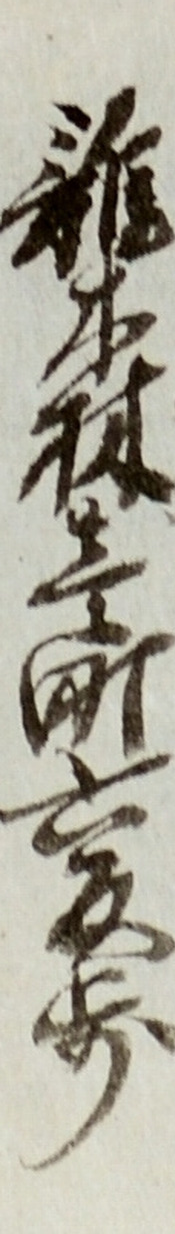雑木林壱町六反歩村中

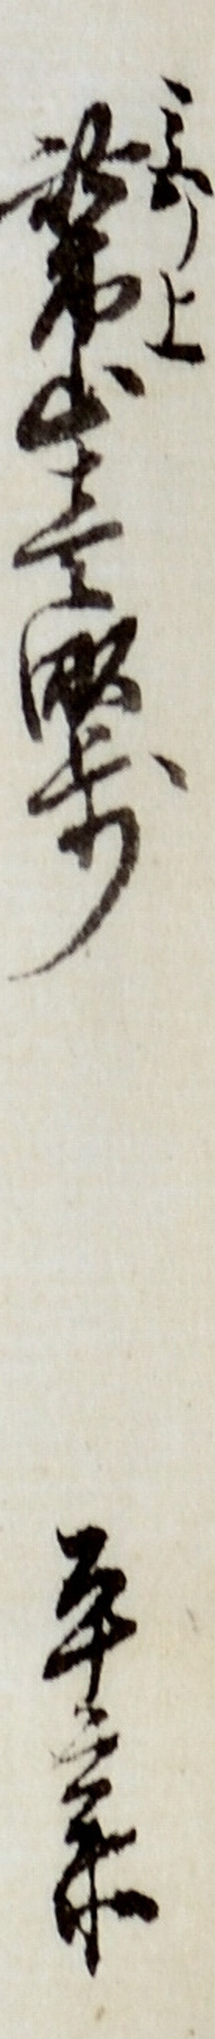柴山壱畝歩平兵衛
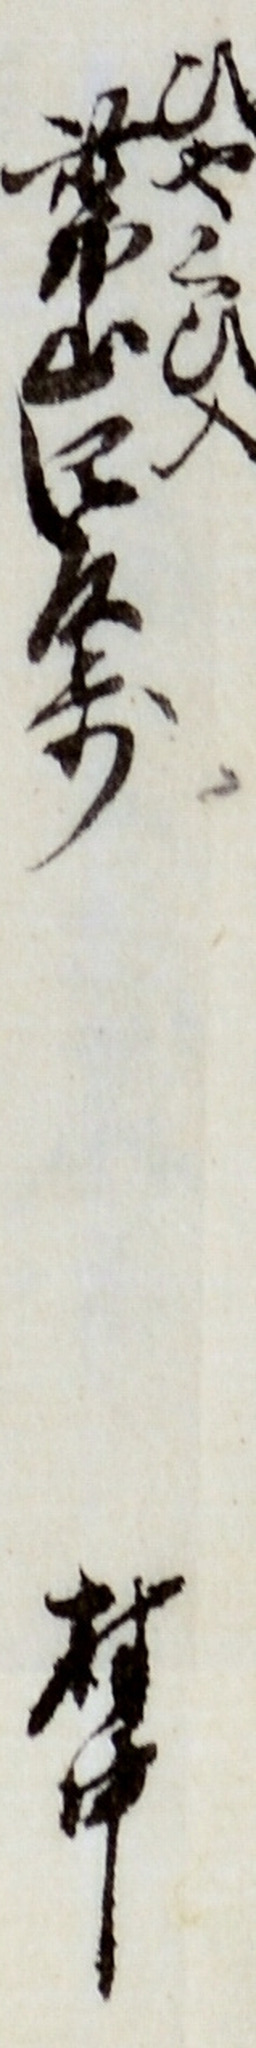柴山四反歩村中
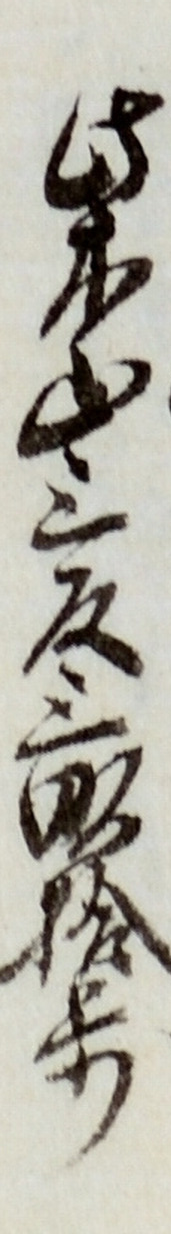柴山三反三畝拾歩同断
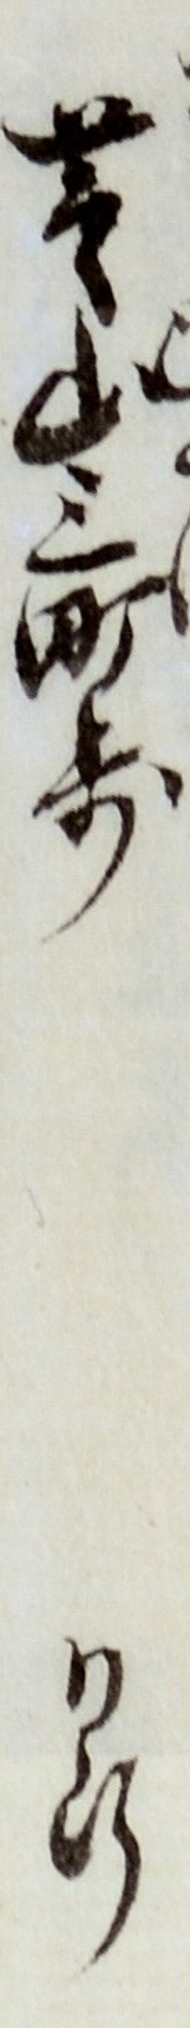芝山三町歩同断
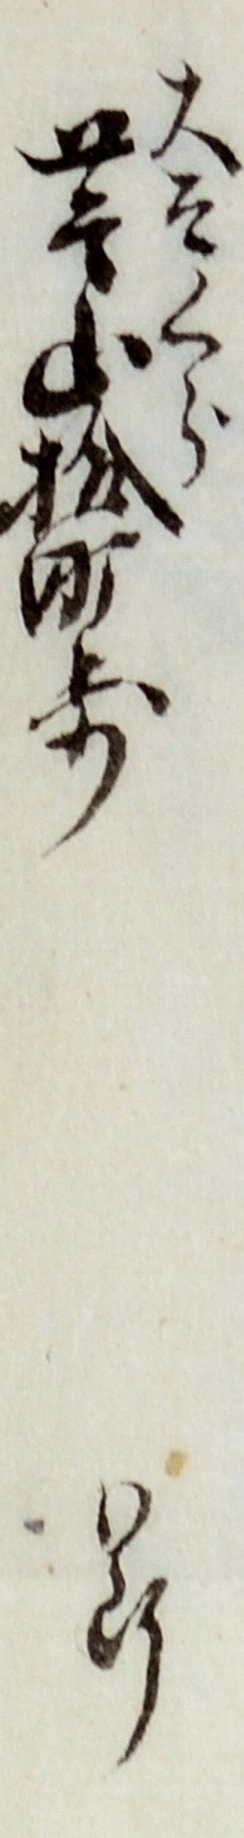芝山三町歩同断
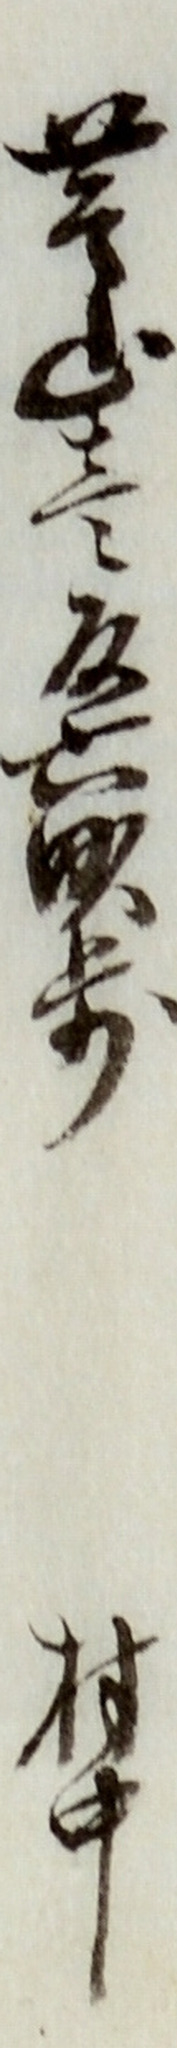芝山壱反六畝歩村中
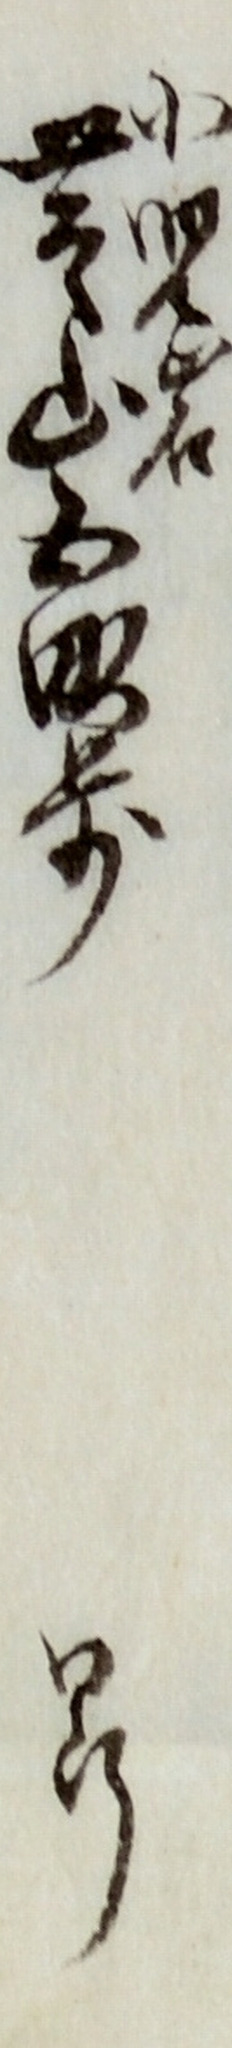芝山五畝歩同断
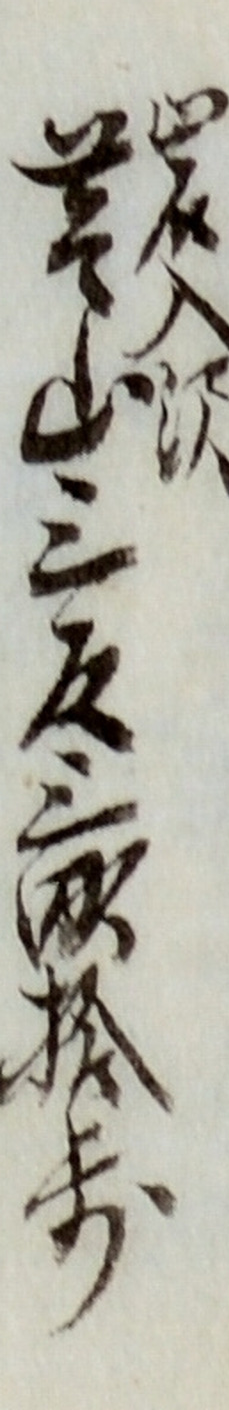芝山三反三畝拾歩同断

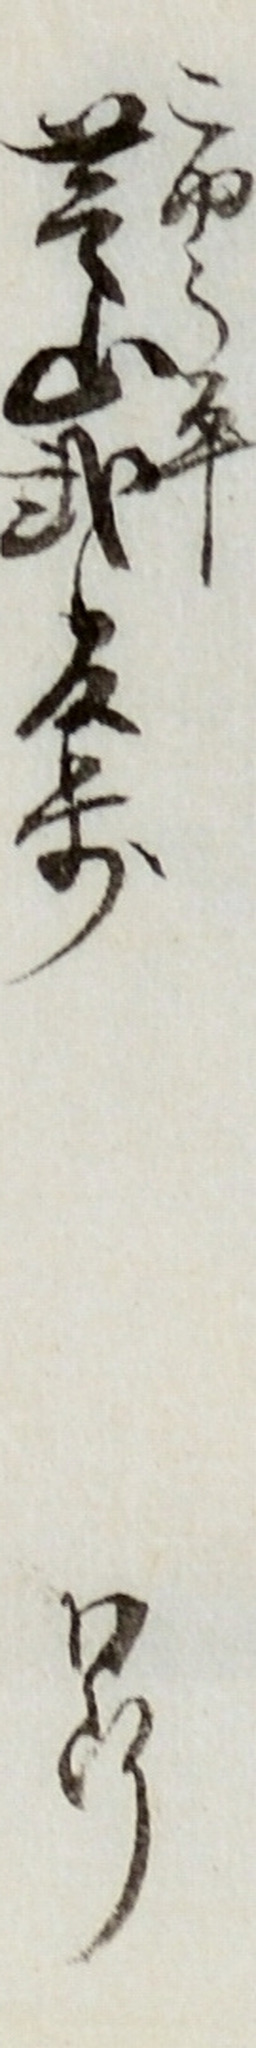芝山弐反歩同断
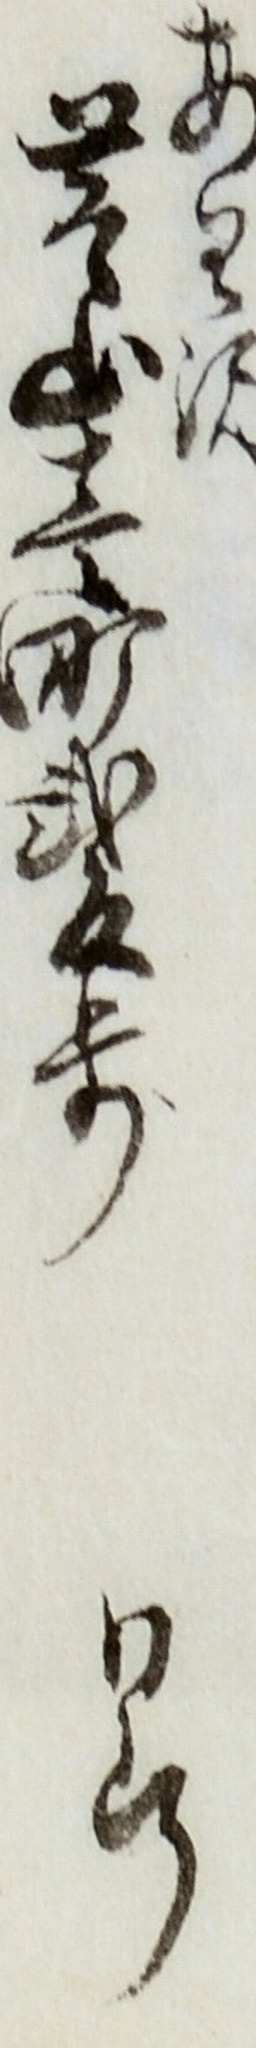芝山壱町弐反歩同断
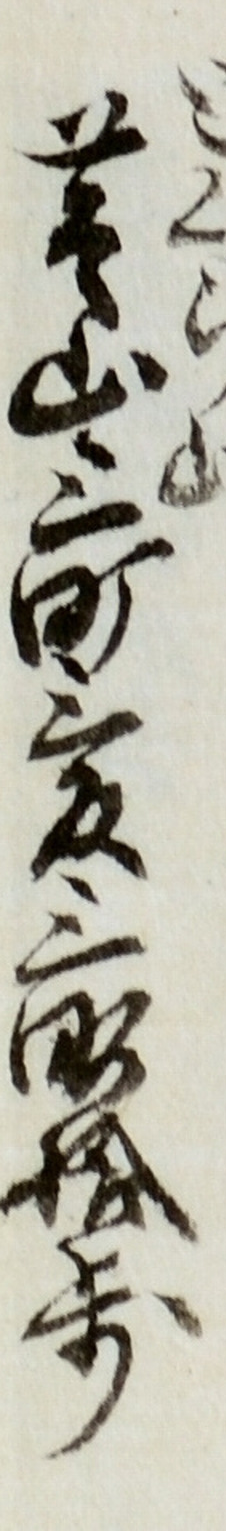芝山三町三反三畝拾歩同断
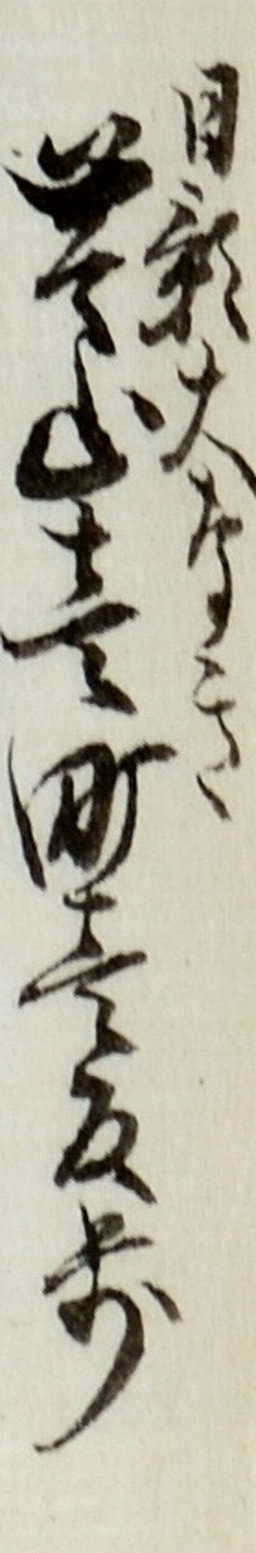芝山壱町壱反歩同断
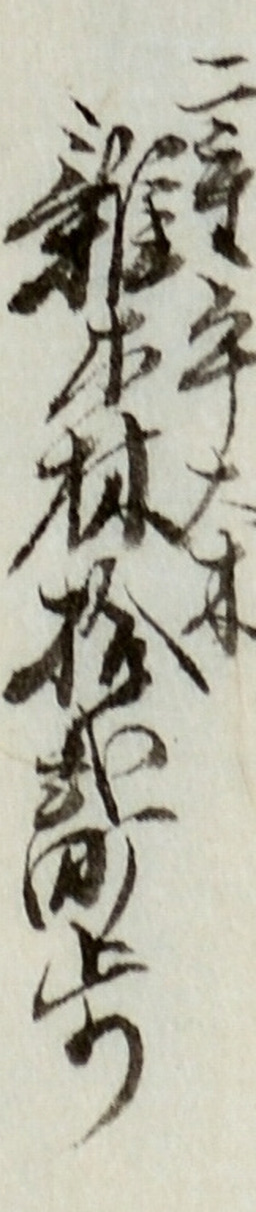雑木林拾弐町歩同断
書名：御領分中山林社地手控
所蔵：伊那市立高遠町図書館・合同会社AMANE
